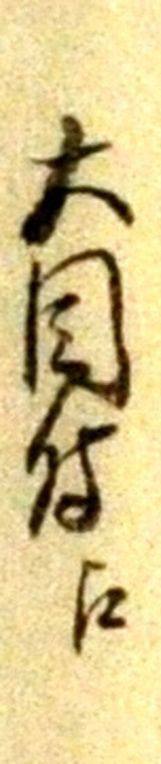大目付え
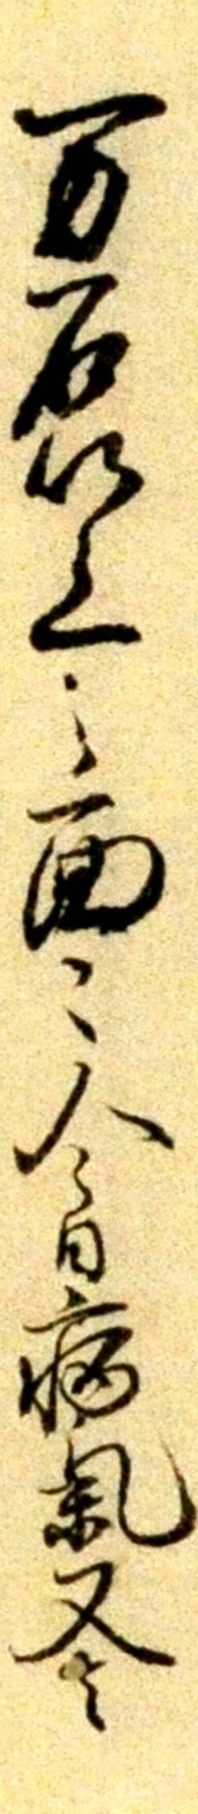万石以上之面々今日病気又は
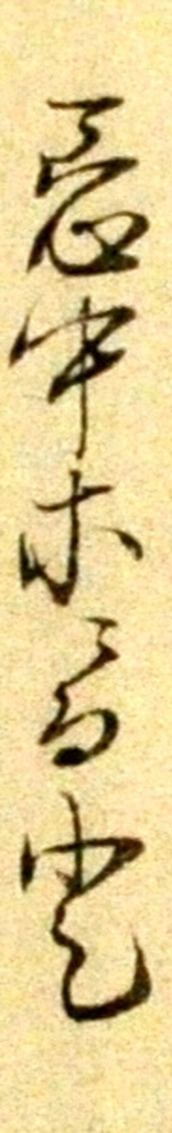忌中等ニ而登
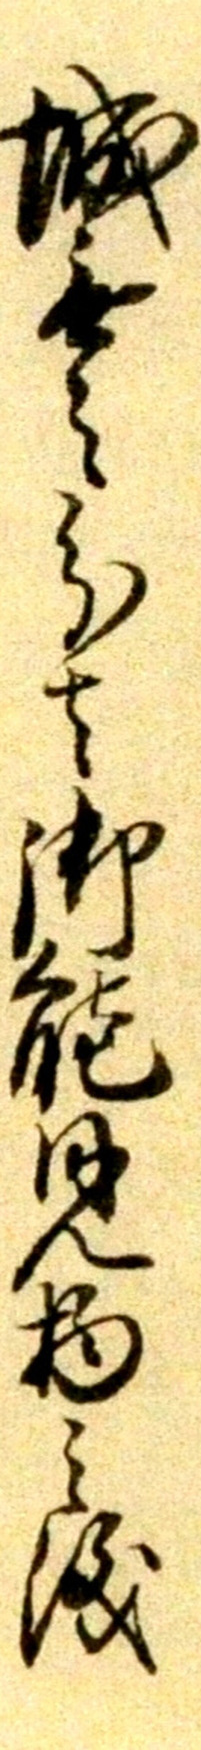城無之分は御能見物之儀
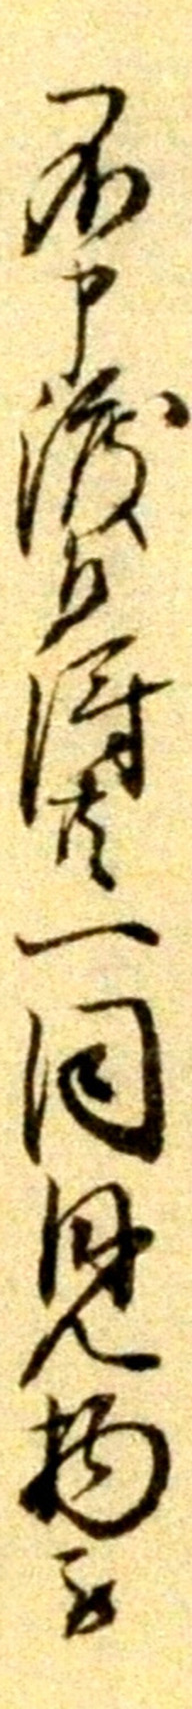不申渡候得共一同見物被
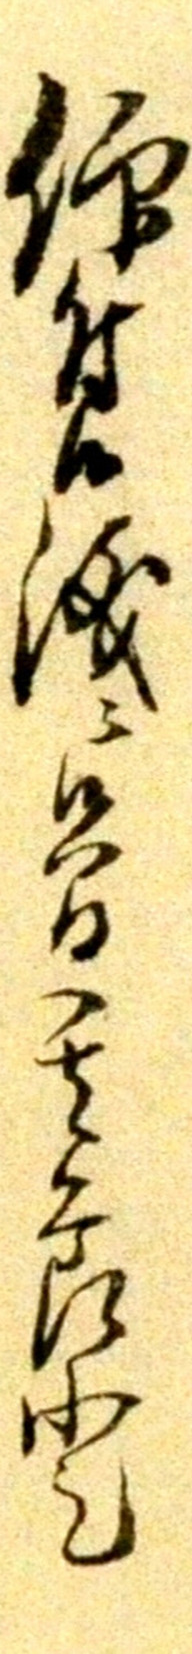仰付候儀ニ候間其節登
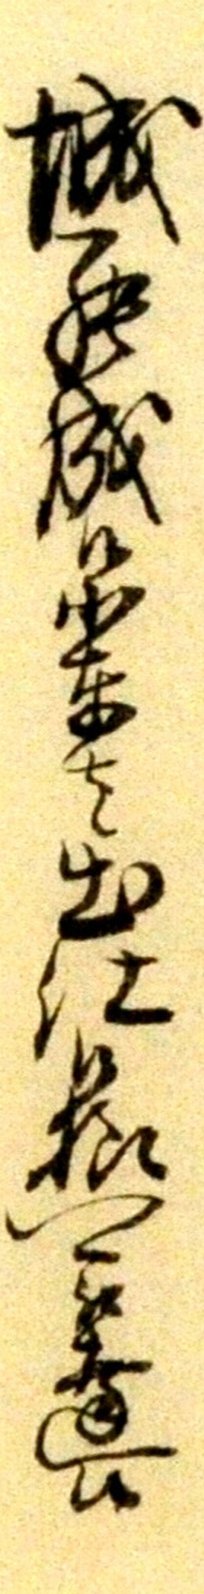城罷成候輩は出仕候様可被達候
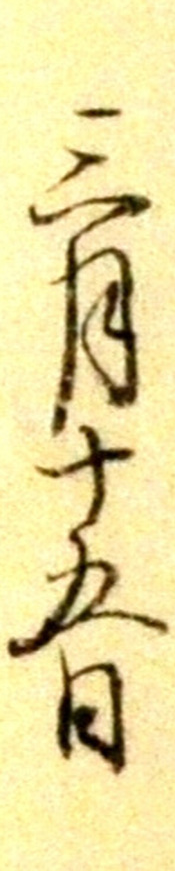三月十五日

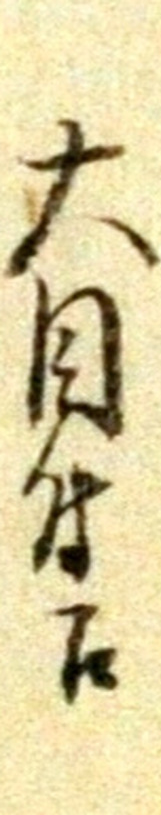大目付え
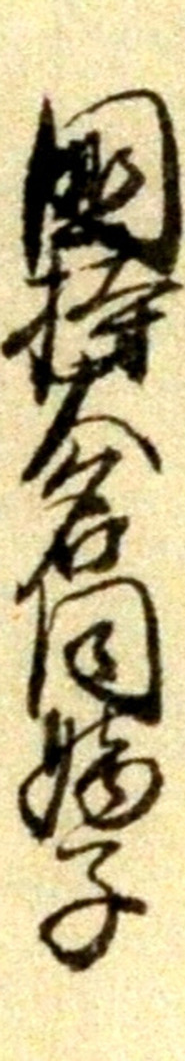国持大名同嫡子
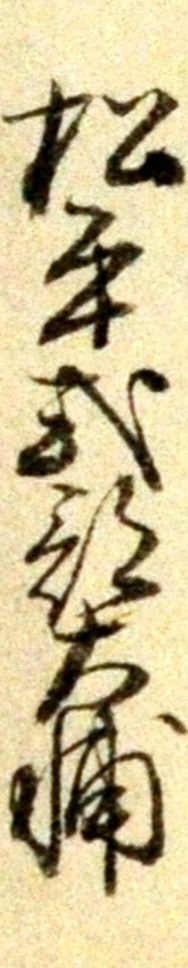松平式部大輔
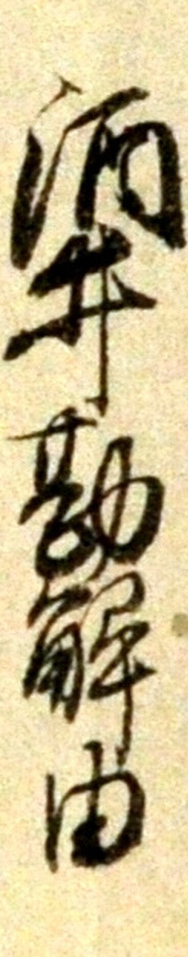酒井勘解由
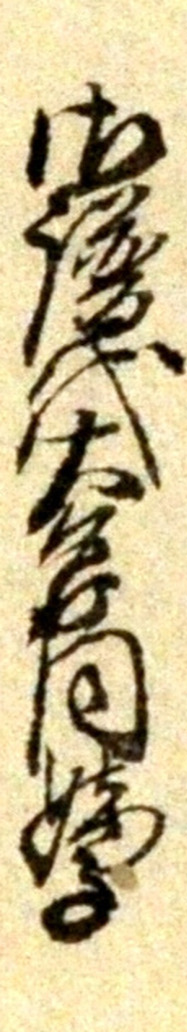御譜代大名同嫡子
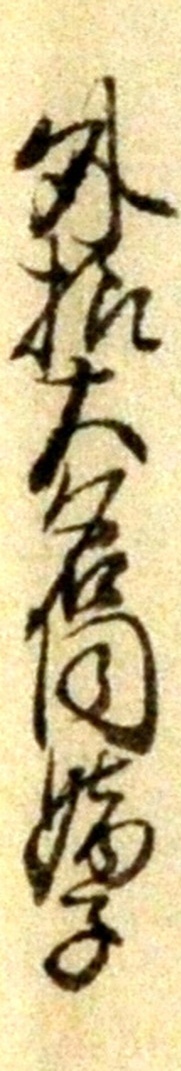外様大名同嫡子
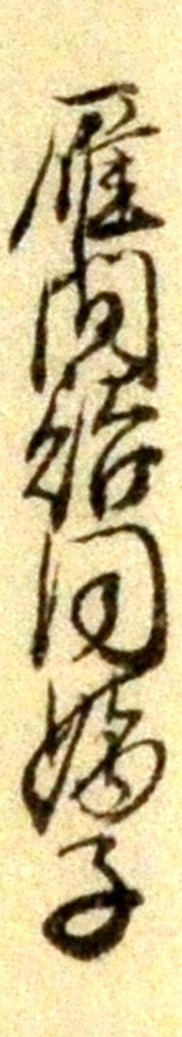雁間詰同嫡子
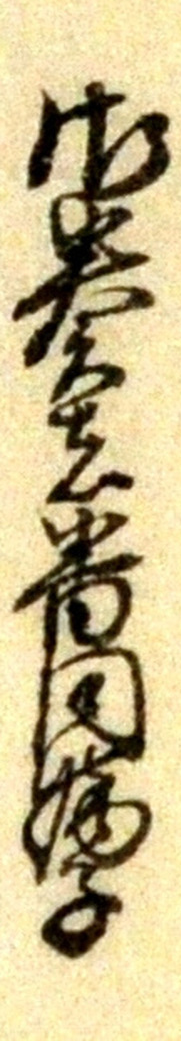御奏者番同嫡子
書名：御移徒相済御祝儀御能ノ節ノ留外
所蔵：伊那市立高遠町図書館・合同会社AMANE
